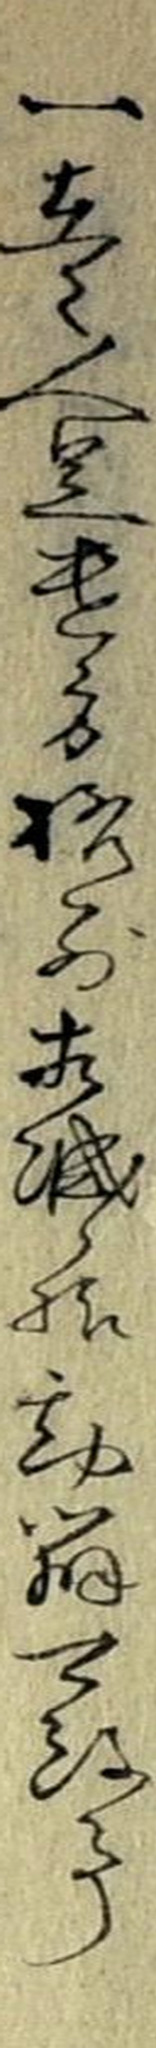一在々人足遣方格別相減候様勘弁可致事
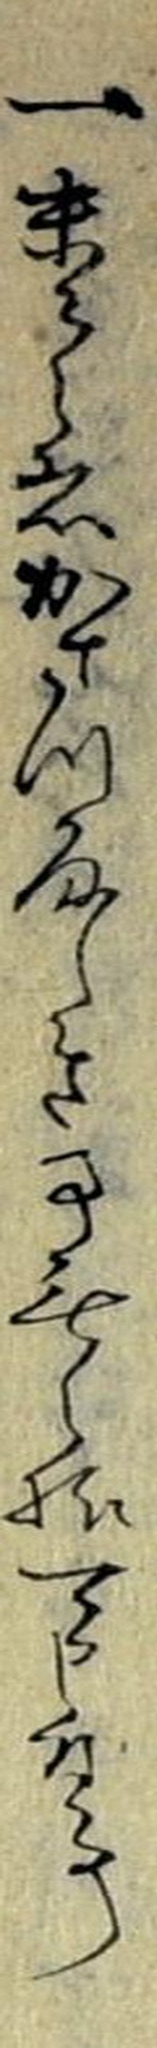一末々之者かさつましき事無之様可申付事
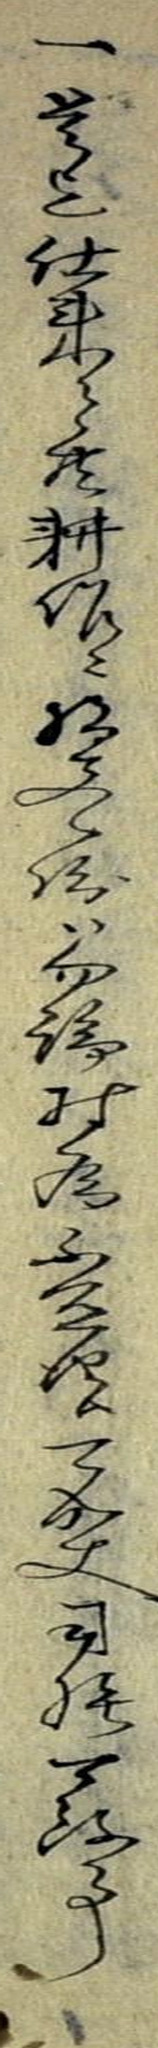一是迄仕来ニ候共耕作ニ指支候儀ハ勿論村為不宜儀ハ可成丈用捨可致事
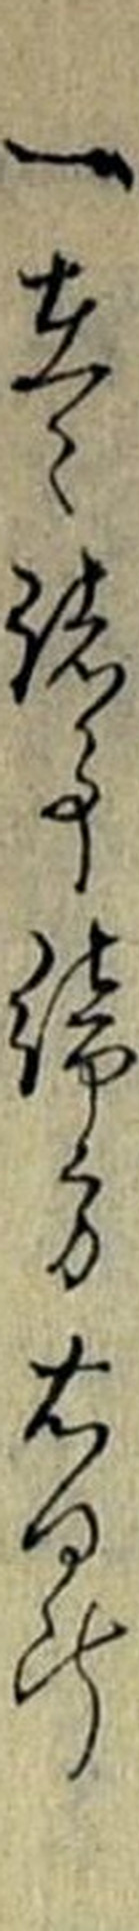一在々諸事締方右同断
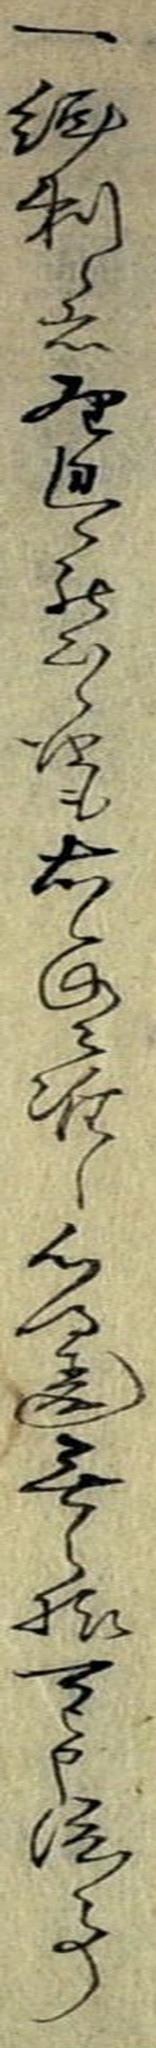一餌刺之者野廻へ罷出候儀も右之趣ニ准し心得違無之様可被申渡事
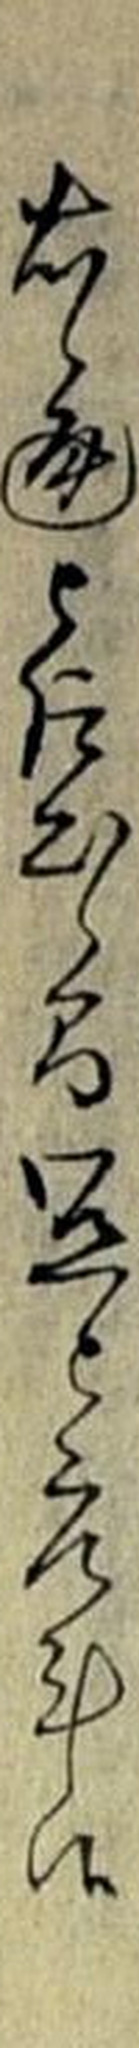右之通被仰出候間宜被取計候
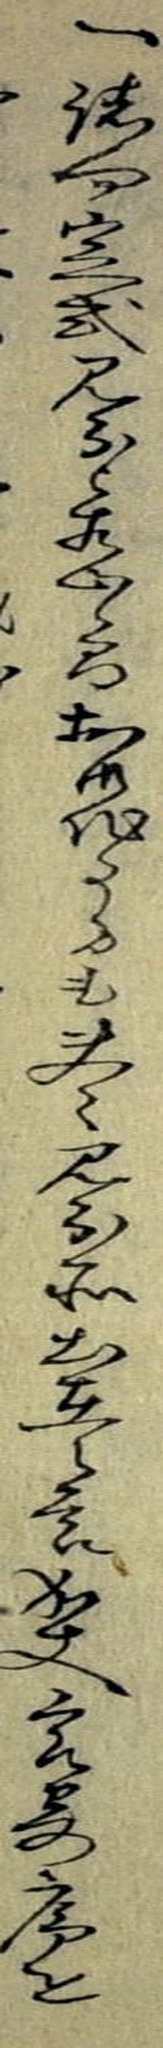一諸向定式見分被相止候間於御作事方も夫々見分所出在之節成丈節寄序を
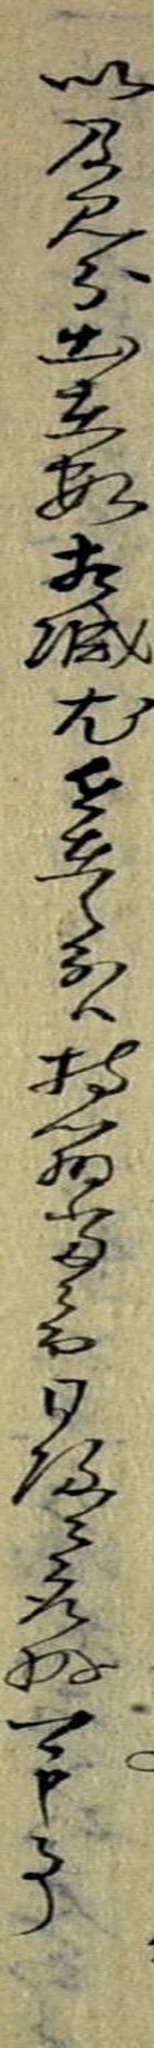以及見分出在数相減尤近在之分ハ持弁当ニ而日帰ニ取扱可申事
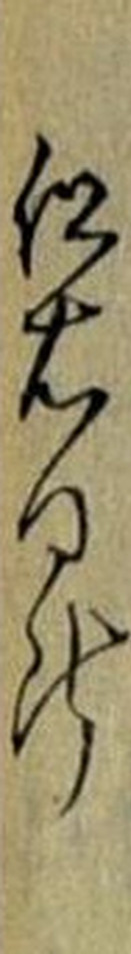但右同断
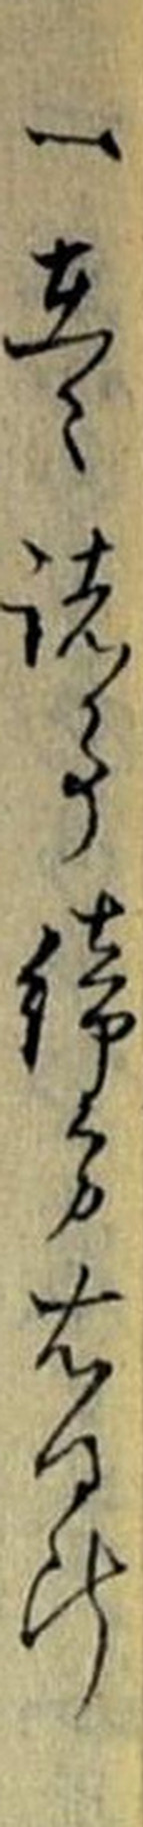一在々諸事締方右同断
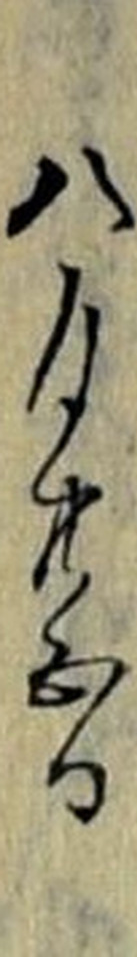八月廿五日
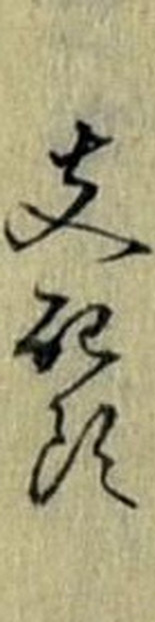支配頭
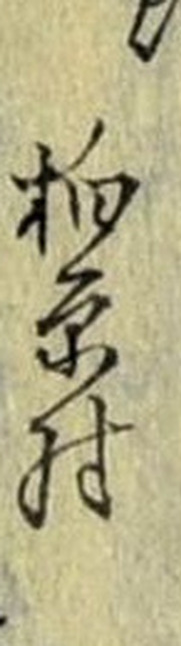柏原村
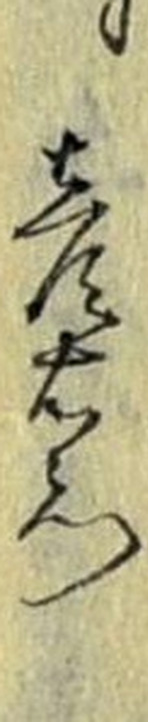彦右衛門

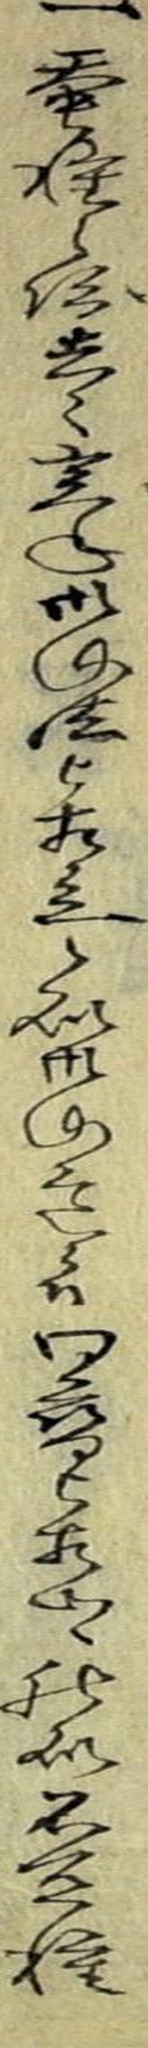一蚕種之儀去々亥年御趣法被相立候処御趣意ニ付同暮被相止候然処不宜種
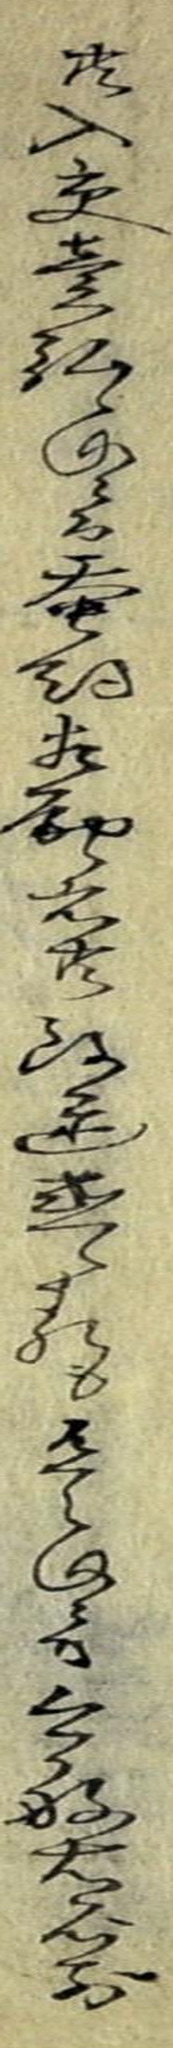共入交売弘候趣ニ而蚕飼相励候者共致迷惑候類も有之趣ニ付今般右名前
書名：命令之部 五
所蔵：福井県文書館 Fukui Prefectural Archives
